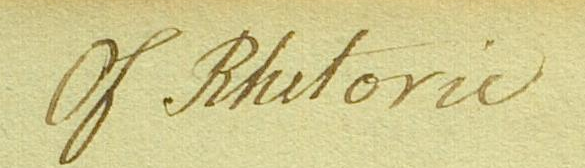Of Rhetoric
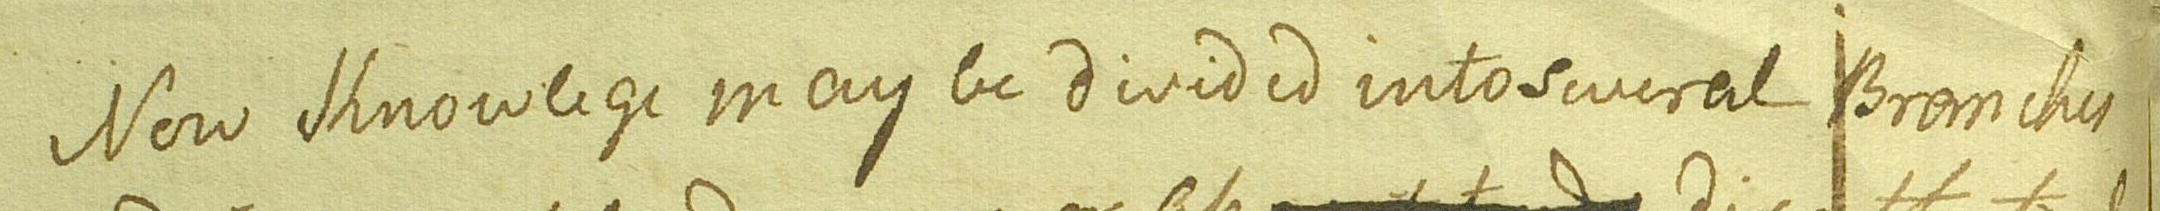New knowledge may be divided into several Branches
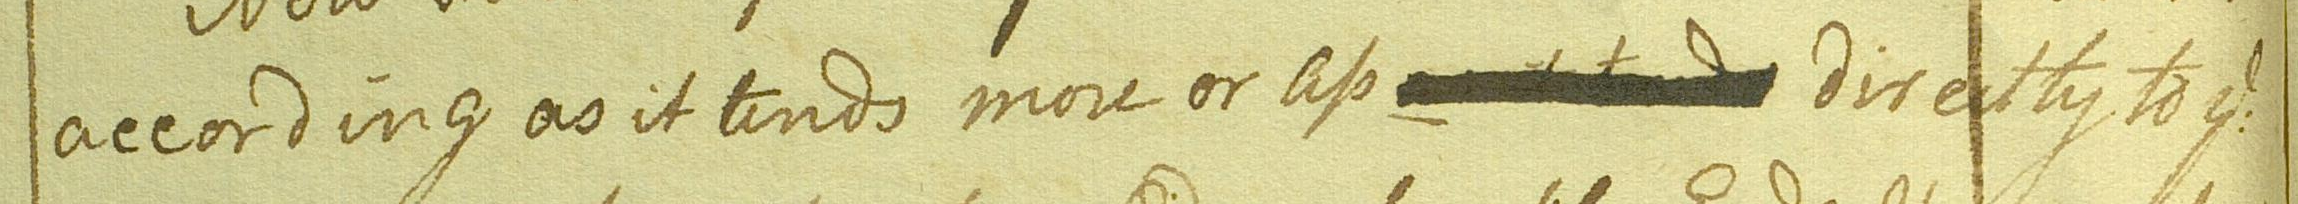according as it tends more or ap [________] directly to y^e:
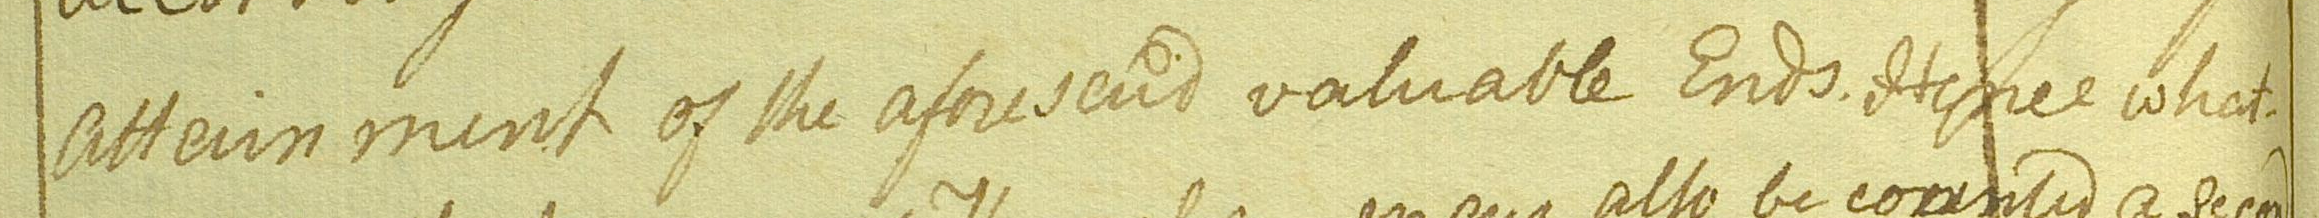attainment of the aforesaid valuable Ends. Hence what
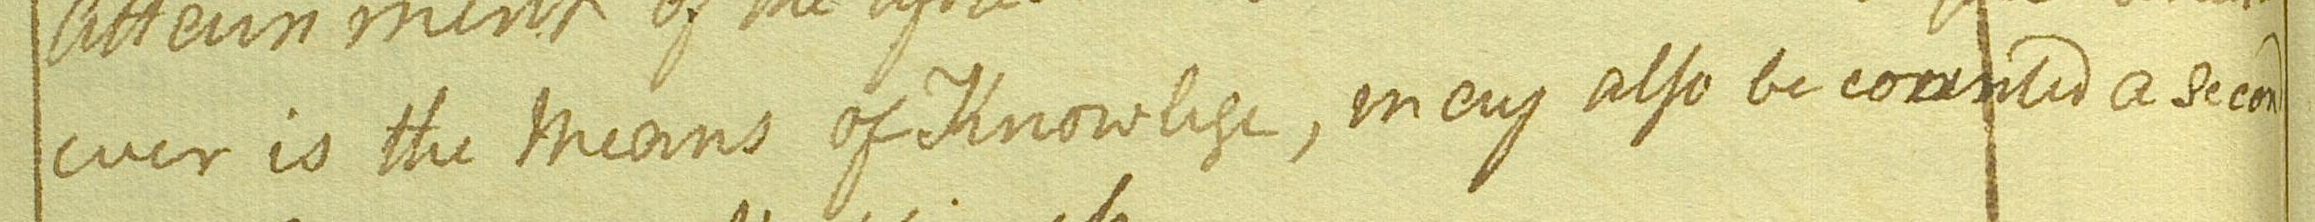ever is the means of Knowledge, may also be counted a second
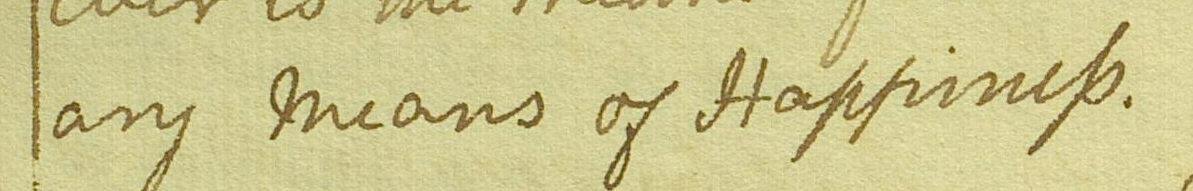ary means of Happiness.
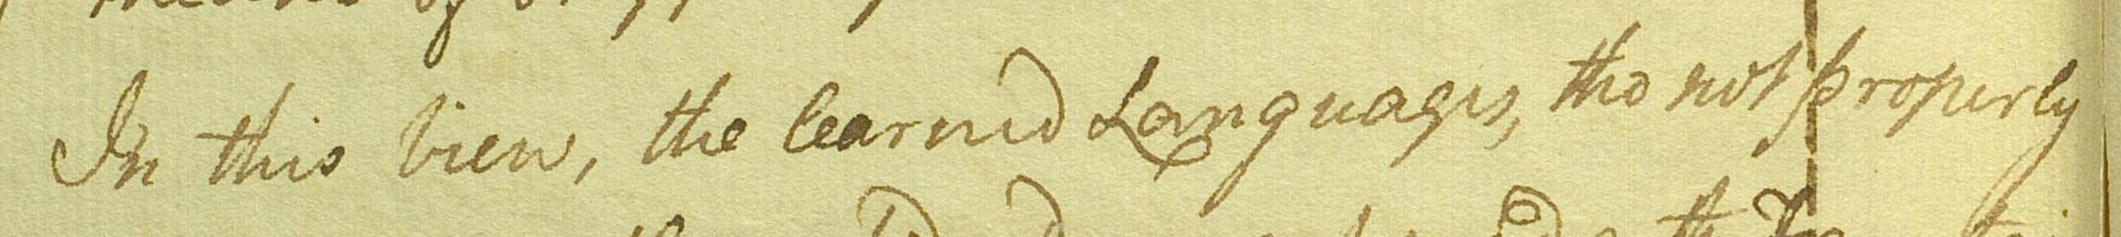In this View, the learned Languages, tho not properly
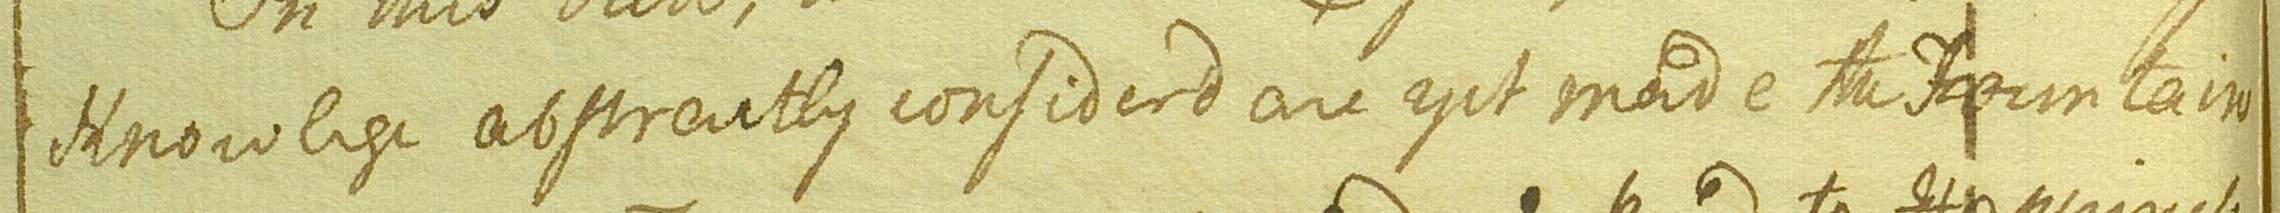knowledge abstractly consider'd are yet made the Fountain
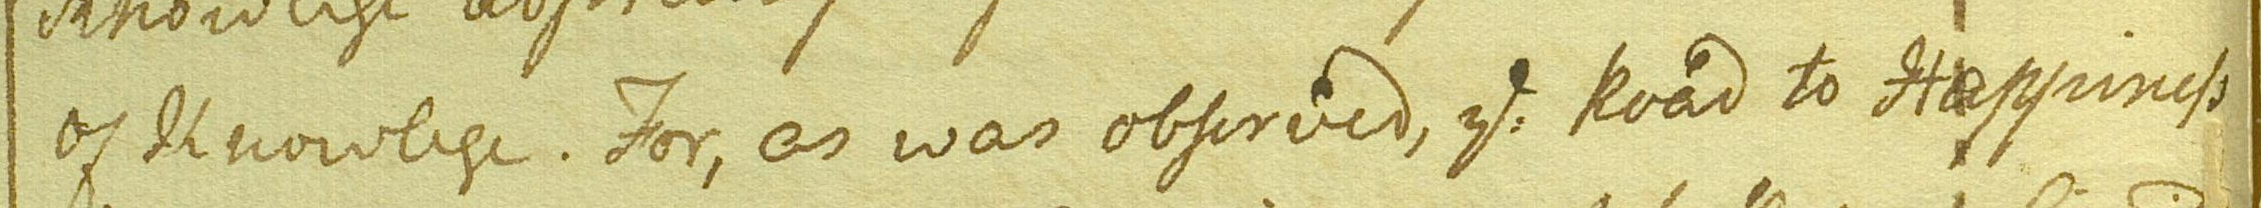of Knowledge. For, as was observed, y^e: Road to Happiness
